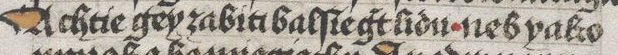A chtie gey zabiti bal ſie ḡt lidu.neb yako
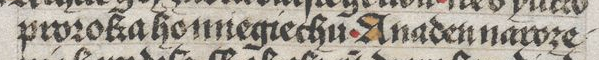proroka ho miegíechu.A naden naroze¬
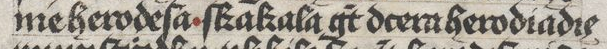níe herodeſa.ſkakala ḡt dcera herodiadie
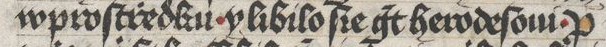wproſtṙedku.y libilo ſie ḡt herodeſoui.Ꝓ¬
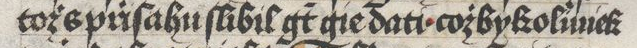toż s pṙiſahu ſlibil ḡt gie dati.coż by koliuiek
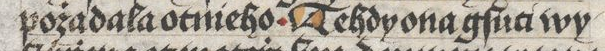pożadala ot nieho.Tehdy ona gſuci wy¬
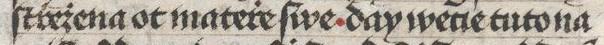ſtṙeżena ot mateṙe ſwe.day wecie tuto na¬
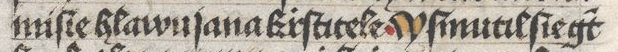miẛie hlawu Jana kṙſtitele.Y ſmutil ſe ḡt
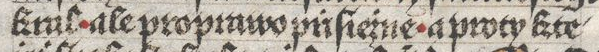kral.ale proprawo pṙiſíeżne.a proty kte¬
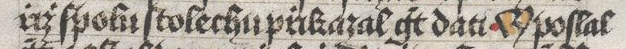ṙiż ſpolu ſtolechu pṙikazal ḡt dati.Ypoſlal¬
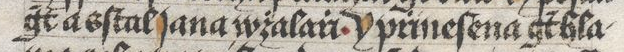ḡt a sſtal Iana wżalaṙi.Y pṙineſena ḡt hla¬
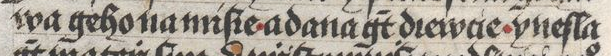wa geho namíſie.a dana ḡt diewcie.y neſla
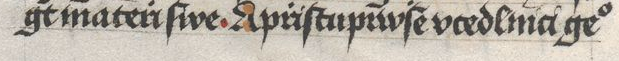ḡt mateṙi ſwe.A pṙiſtupiwẛe vċedlníci geo
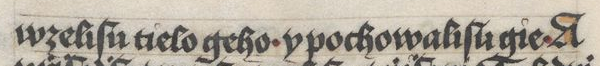wzeliſu tielo geho.y pochowaliſu gie.A
